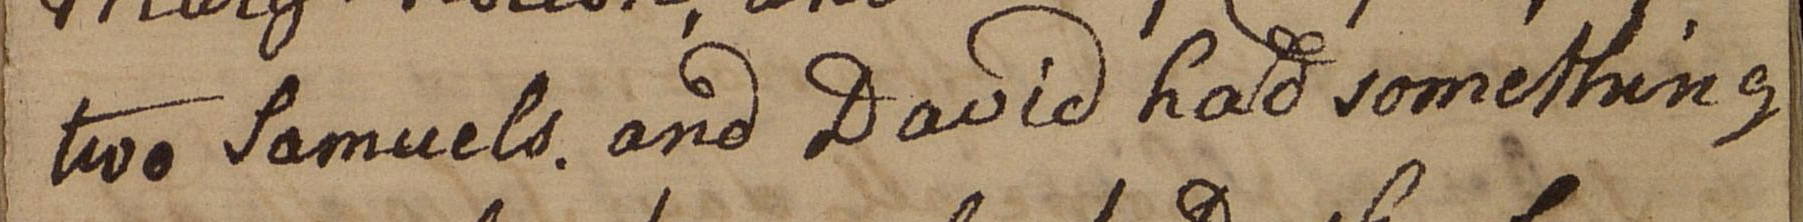two Samuels, and David had something
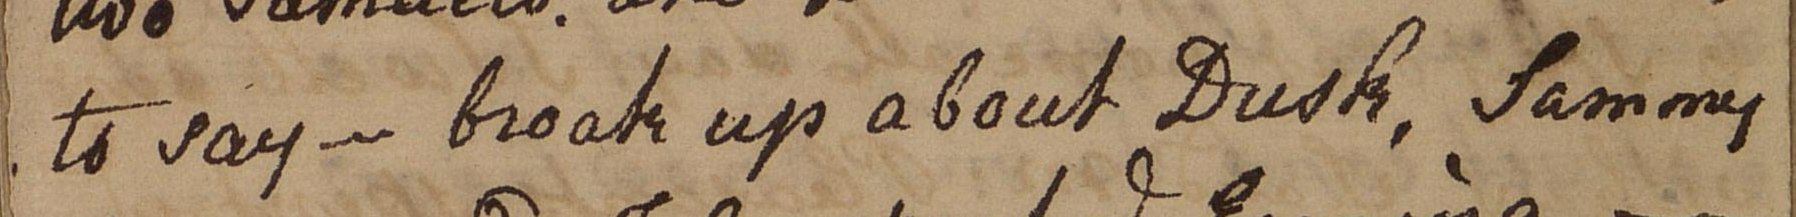to say- broak up about Dusk, Sammy
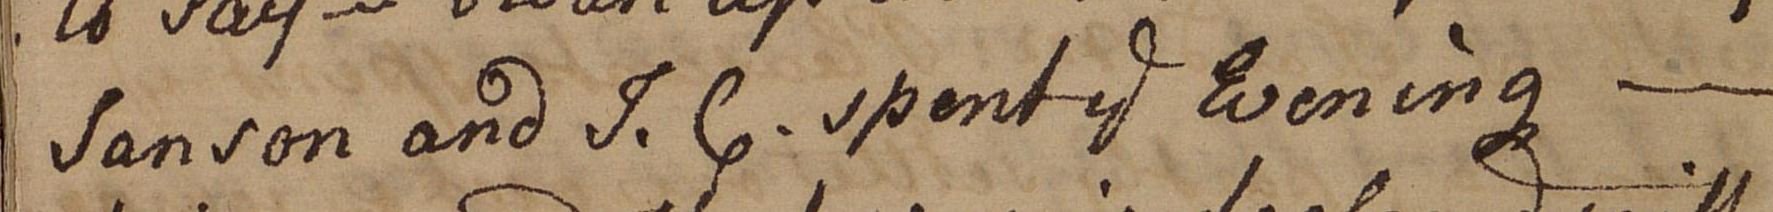Sanson and J.C. spent y^e Evening-
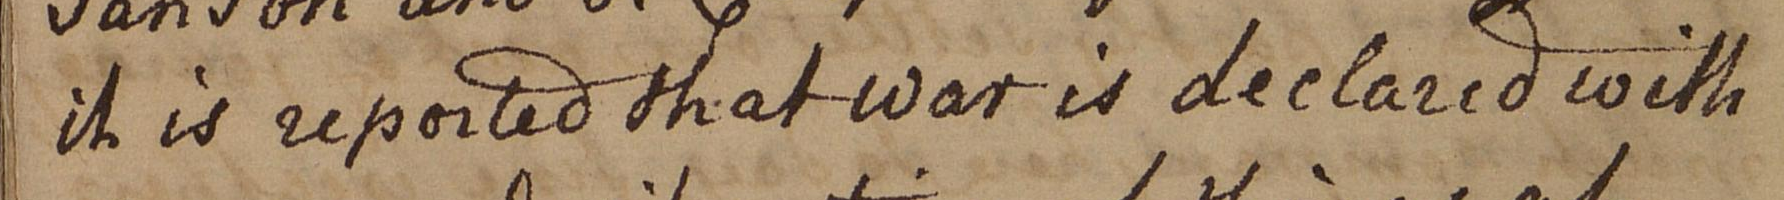it is reported that war is declared with
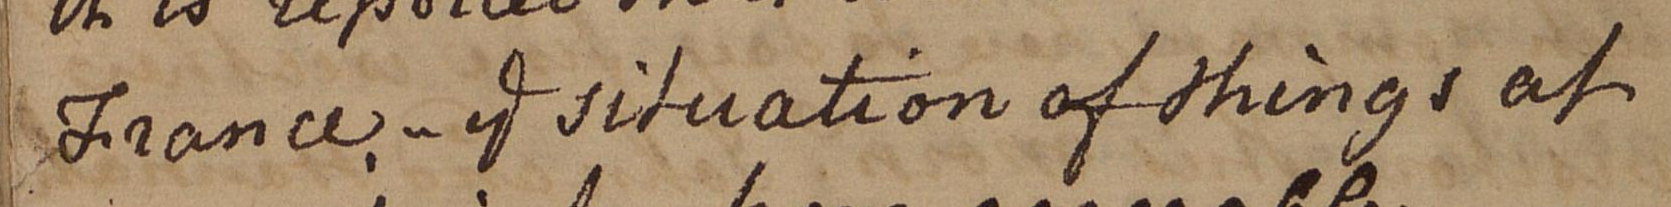France- y^e situation of things at
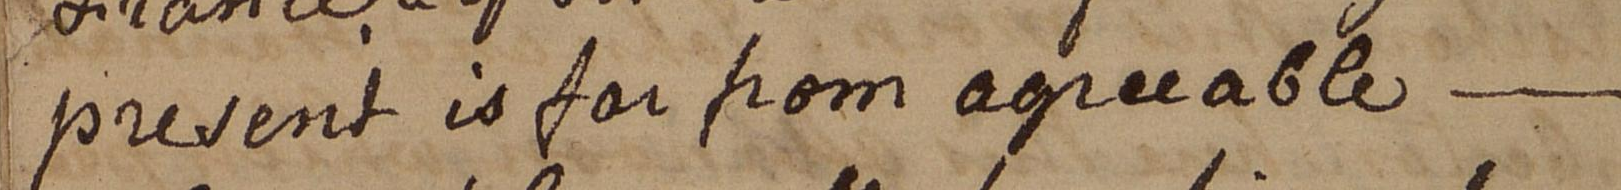present is far from agreeable-
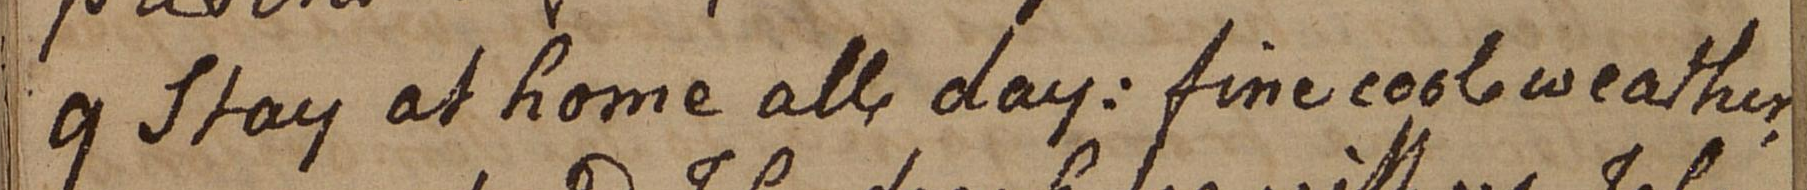9 Stay at home all day: fine cool weather,
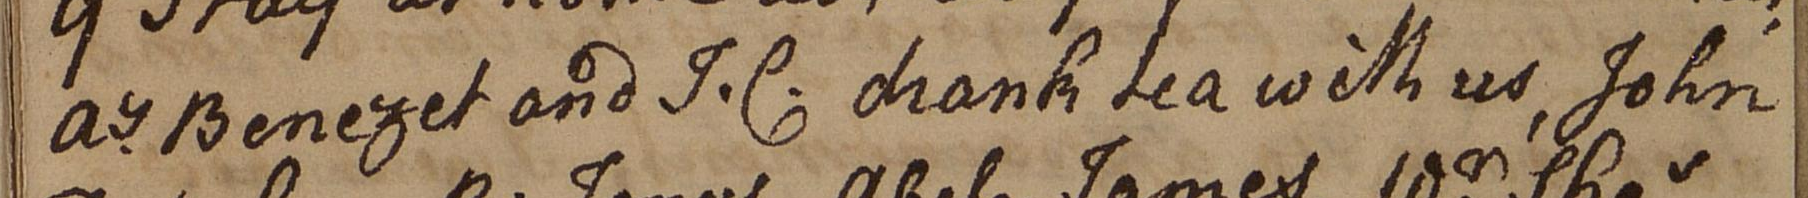A^y. Benezet and J.C. drank tea with us, John
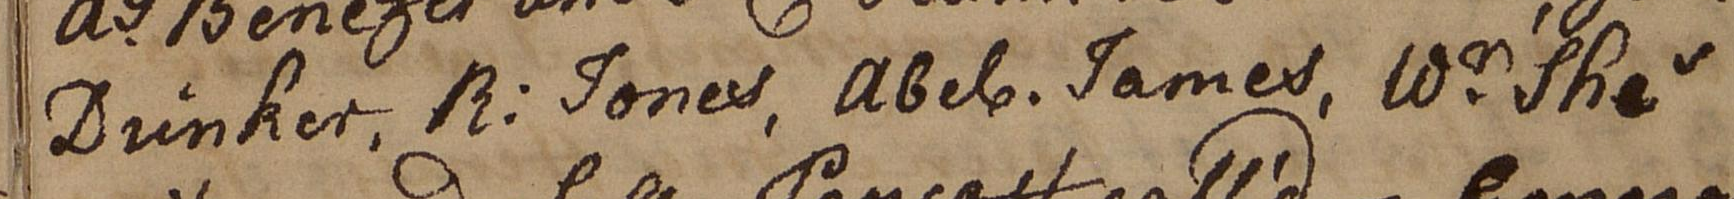Drinker, R: Jones, Abel. James, W^m. She^s
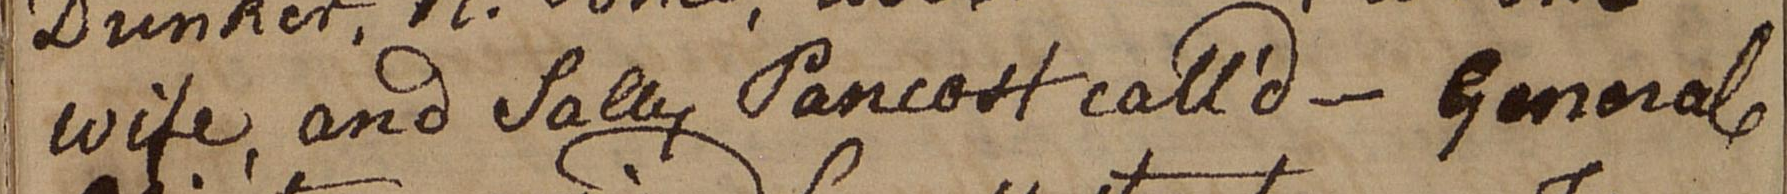wife, and Sally Pancost call'd- General
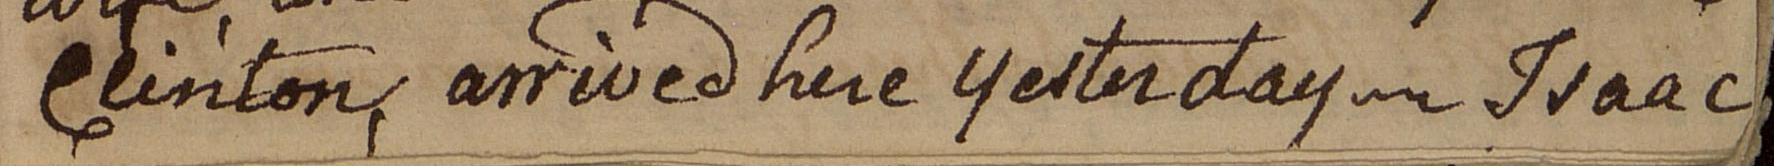Clinton, arrived here yesterday- Isaac
